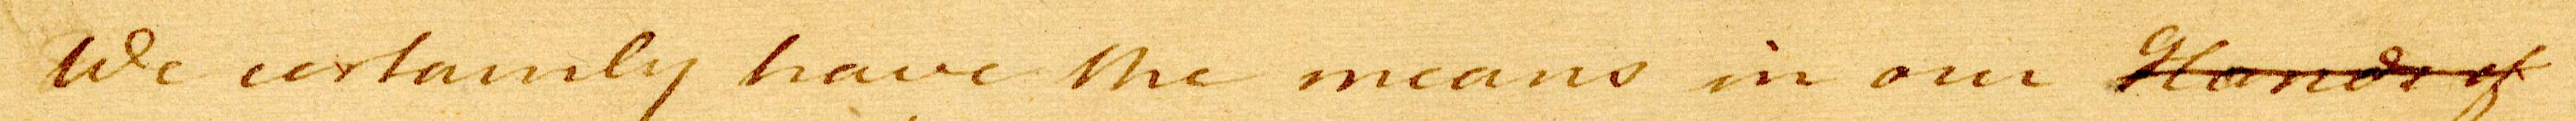We certainly have the means in our [Hands of]
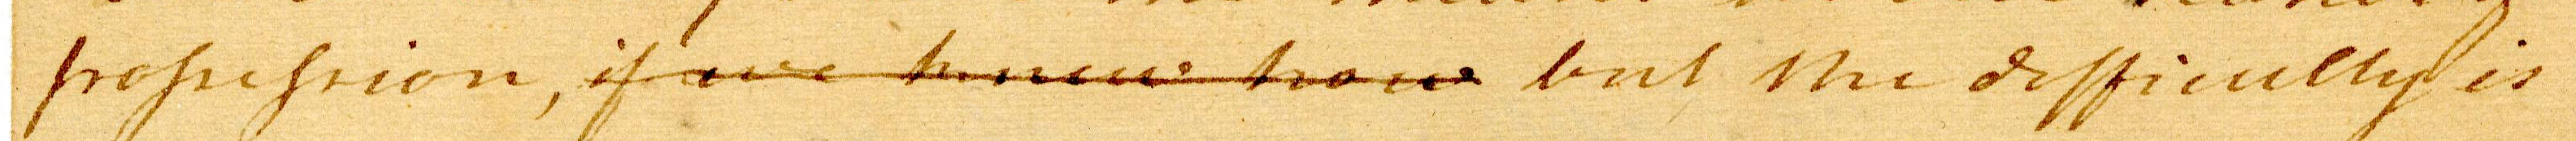possession, [if we knew how] but the difficulty is
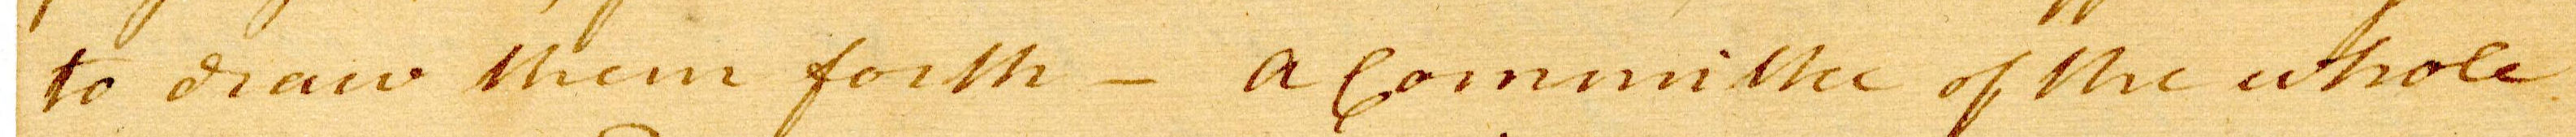to draw them forth- a Committee of the whole
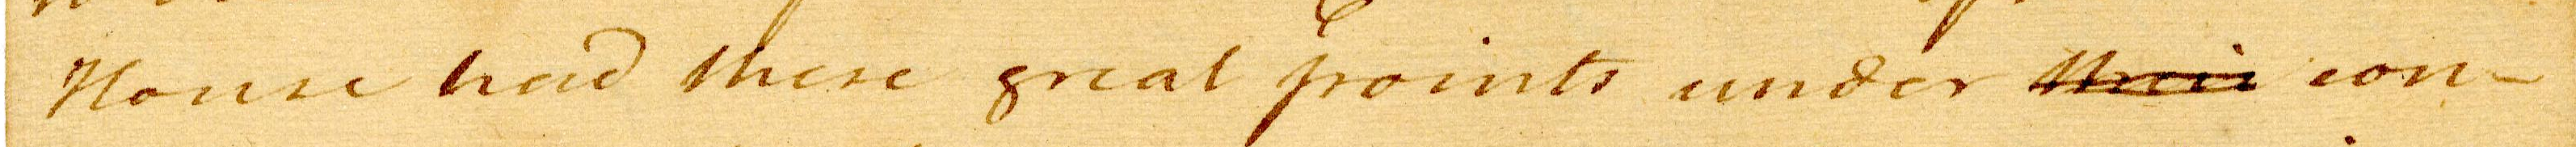House had there great points under [this] con-
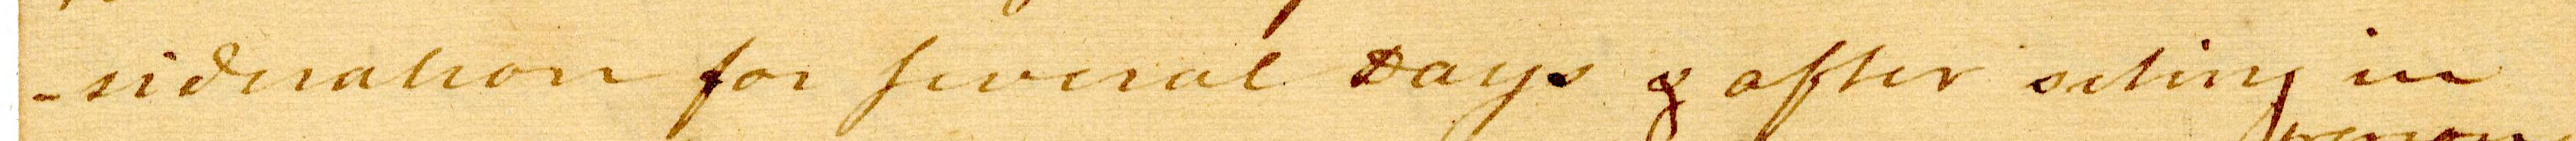-sideration for several Days & after siting in
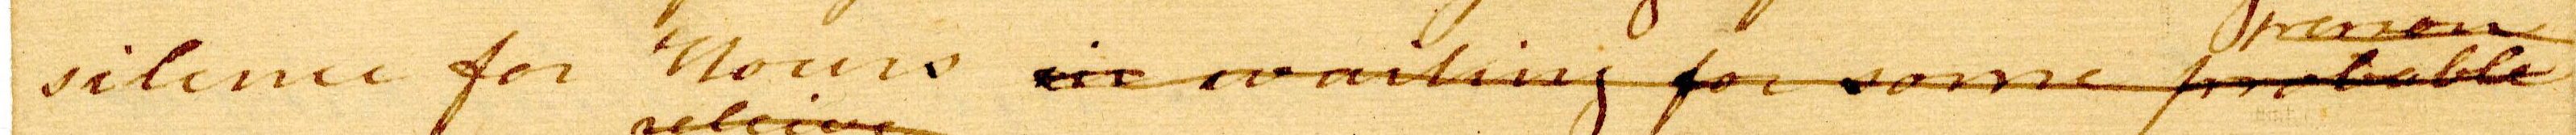silence for Hours [in waiting for some probable]
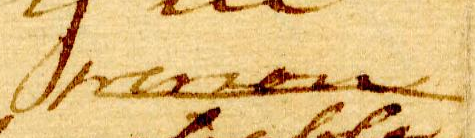person
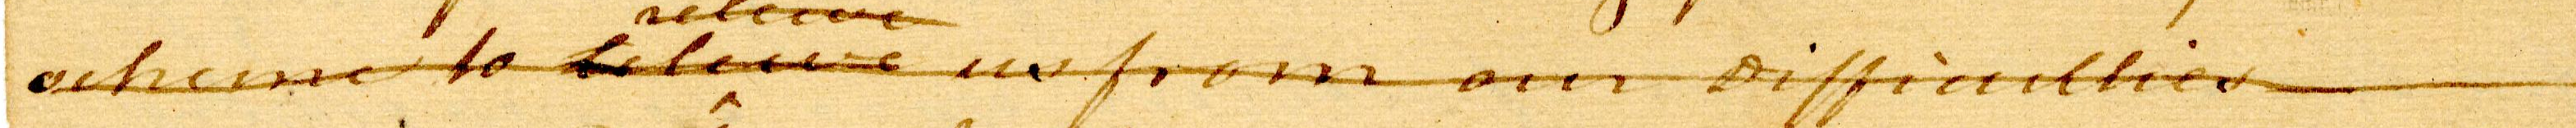[scheme to relieve us from our difficulties-]
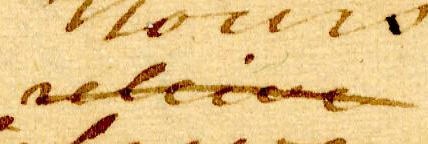[releive]
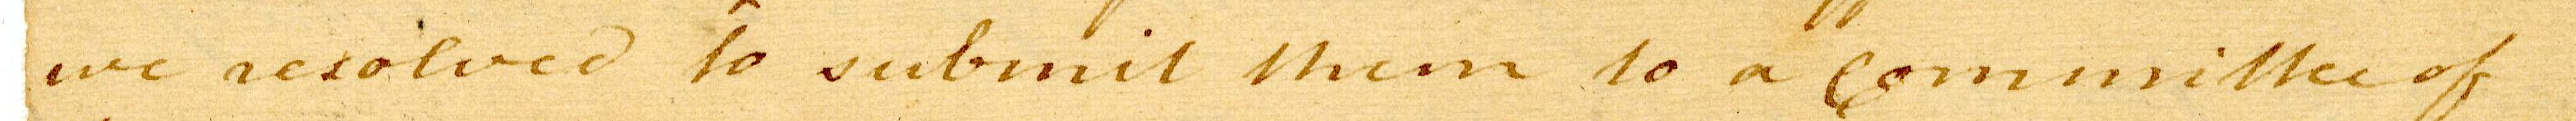we resolved to submit them to a Committee of
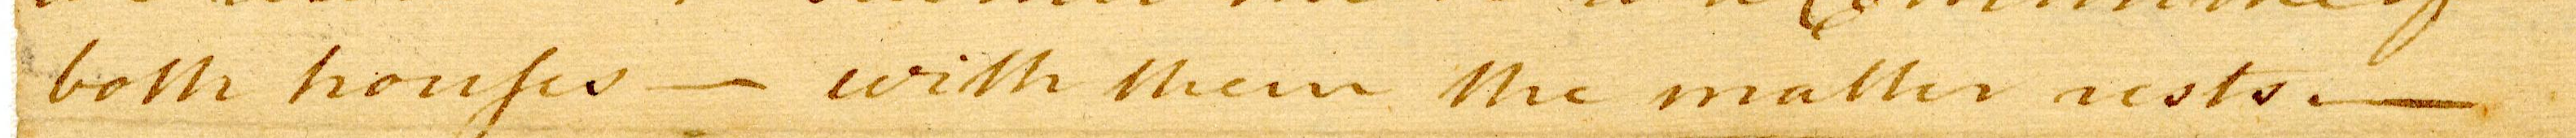both houses- with them the matter rests-
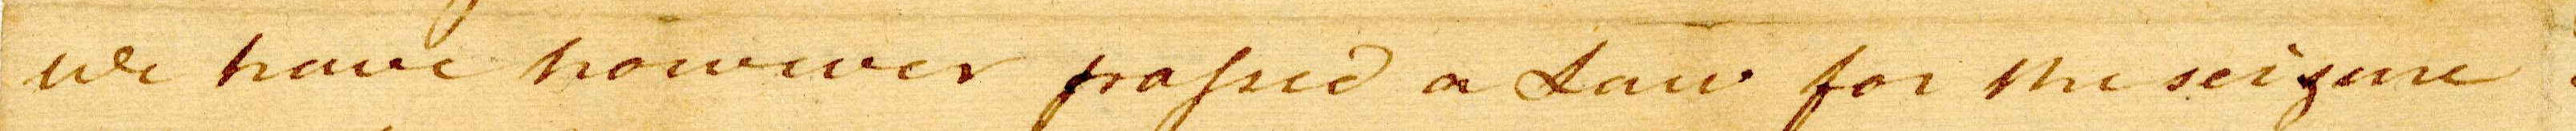We have however passed a Law for the seizure
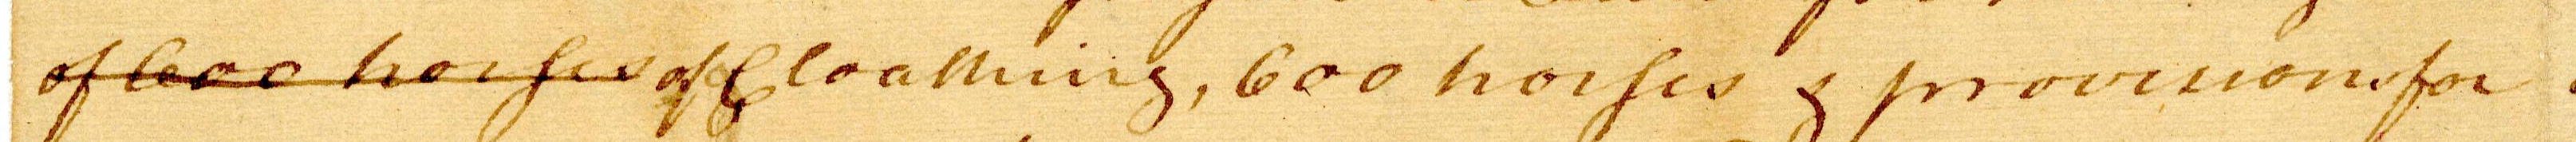[of 600 horses] of of Cloathing, 600 horses & provisions for
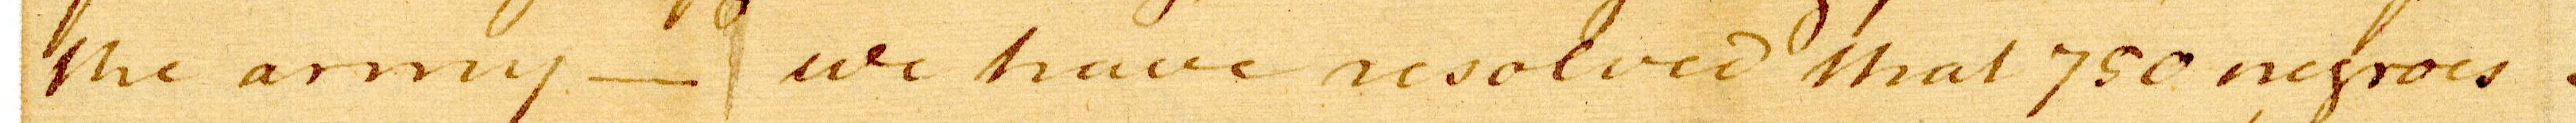the army- we have resolved that 700 negroes
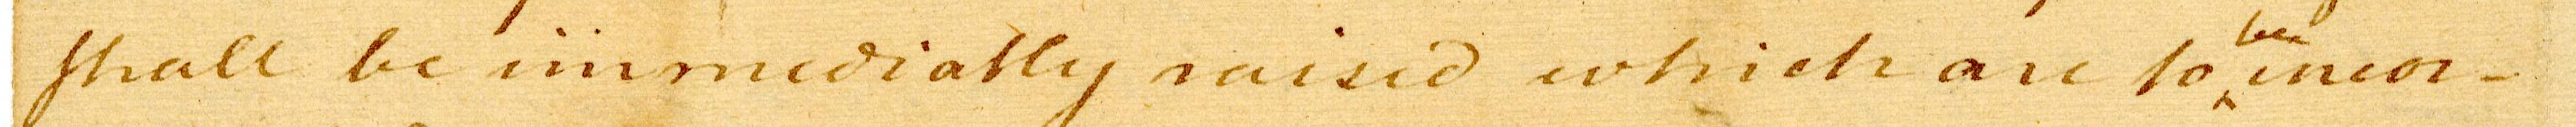shall be immediatly raised which are to ^ incor-
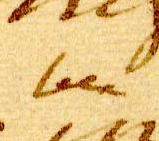be
